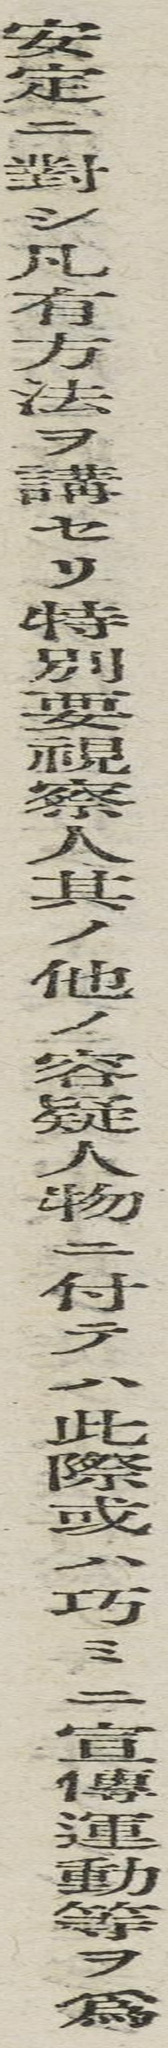安定ニ対シ凡有力法ヲ講セリ特別要視察人其ノ他ノ容疑人物ニ付テハ此際或ハ巧ミニ宣伝運動等ヲ為
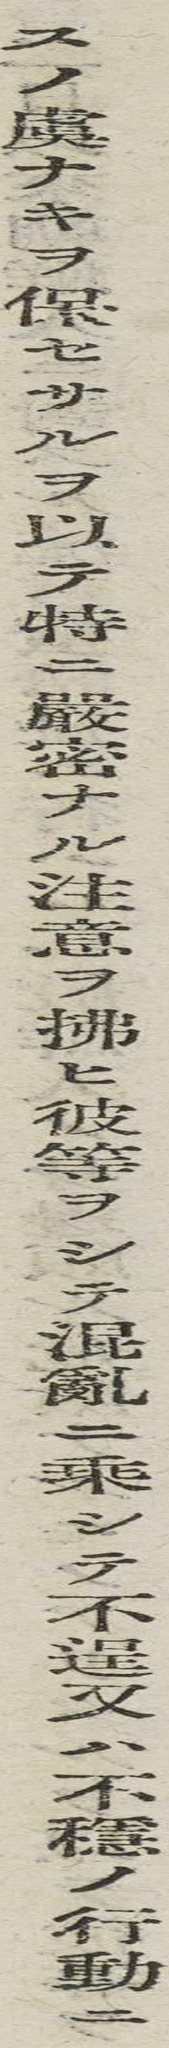スノ虞ナキヲ保セサルヲ以テ特ニ厳密ナル注意ヲ払ヒ彼等ヲシテ混乱ニ乗シテ不逞又ハ不穏ノ行動ニ
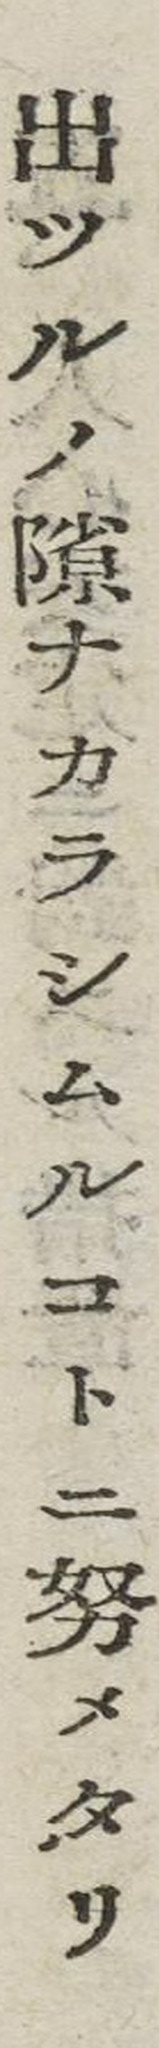出ツルノ隙ナカラシムルコトニ努メタリ
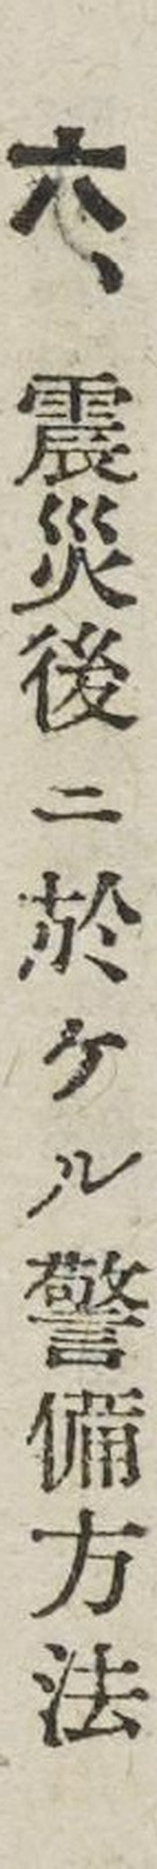六、震災後ニ於ケル警備方法
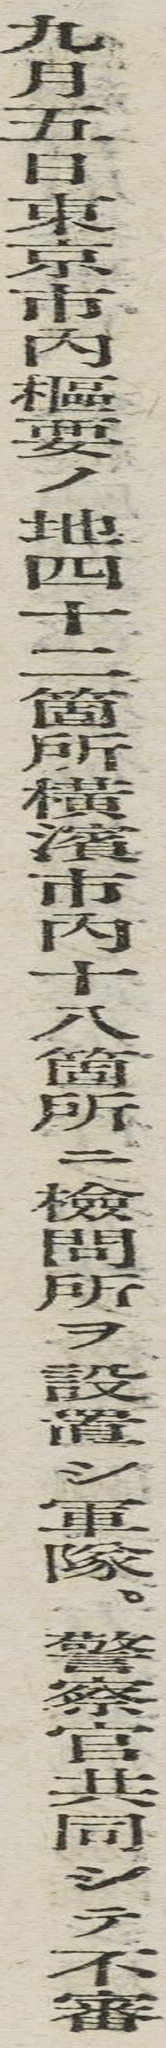九月五日東京市内枢要ノ地四十二箇所横浜市内十八箇所ニ検問所ヲ設置シ軍隊、警察官共同シテ不審
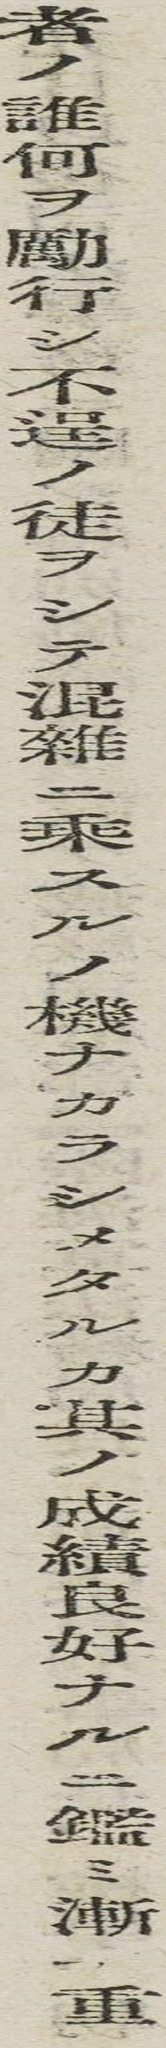者ノ誰何ヲ励行シ不逞ノ徒ヲシテ混雑ニ乗スルノ機ナカラシメタルカ其ノ成績良好ナルニ鑑ミ漸次重
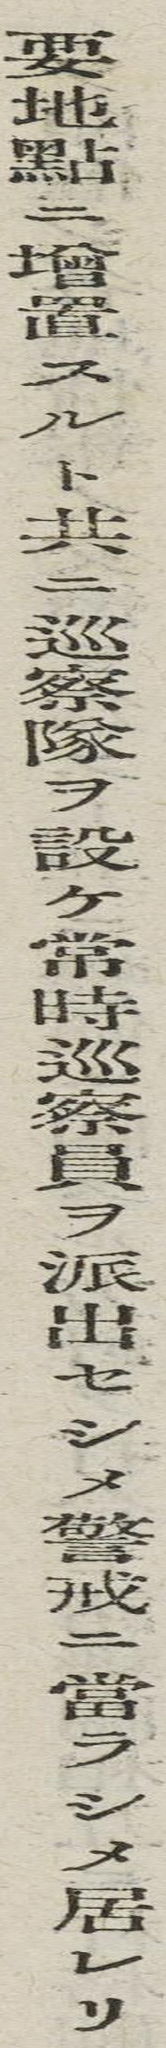要地点ニ増置スルト共ニ巡察隊ヲ設ケ常時巡察員ヲ派出セシメ警戒ニ当ラシメ居レリ
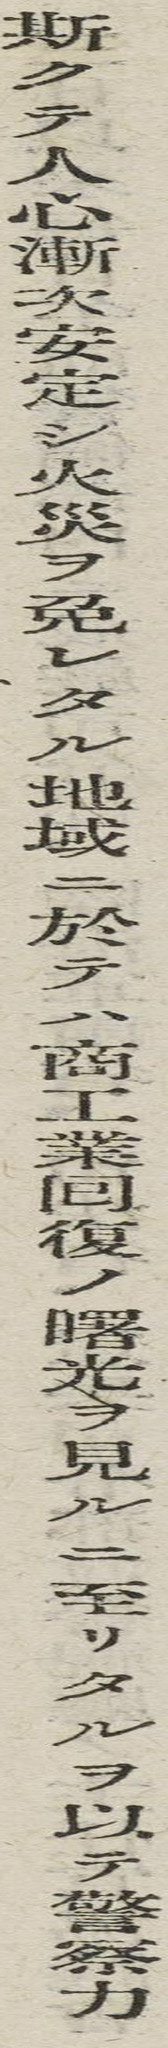斯クテ人心漸次安定シ火災ヲ免レタル地域ニ於テハ商工業回復ノ曙光ヲ見ルニ至リタルヲ以テ警察力
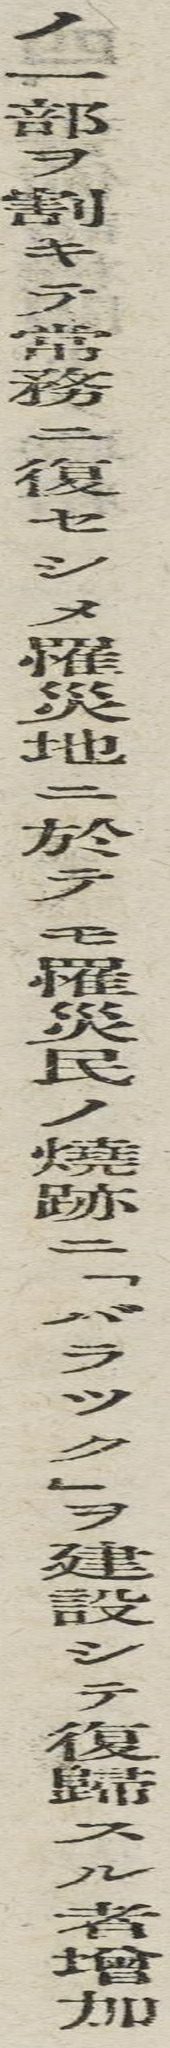ノ一部ヲ割キテ常務ニ復セシメ罹災地ニ於テモ罹災民ノ焼跡ニ「バラック」ヲ建設シテ復帰スル者増加
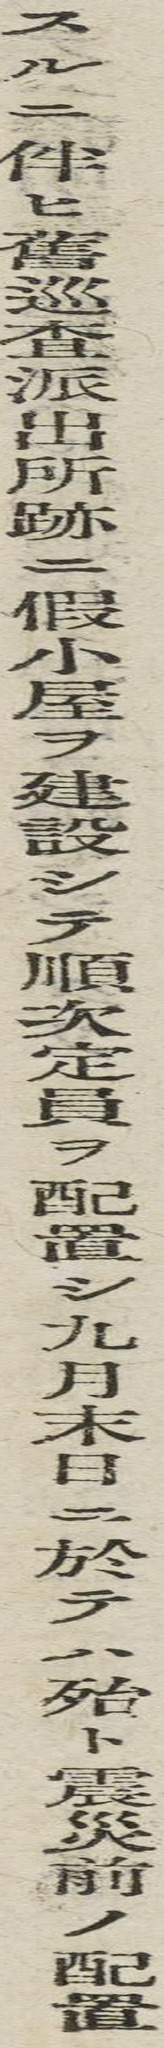スルニ伴ヒ旧巡査派出所跡ニ仮小屋ヲ建設シテ順次定員ヲ配置シ九月末日ニ於テハ殆ト震災前ノ配置
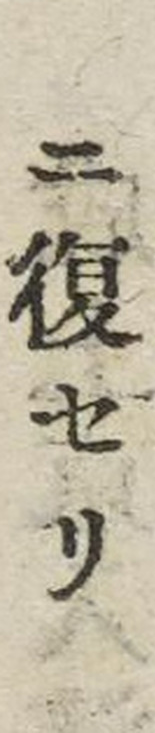ニ復セリ
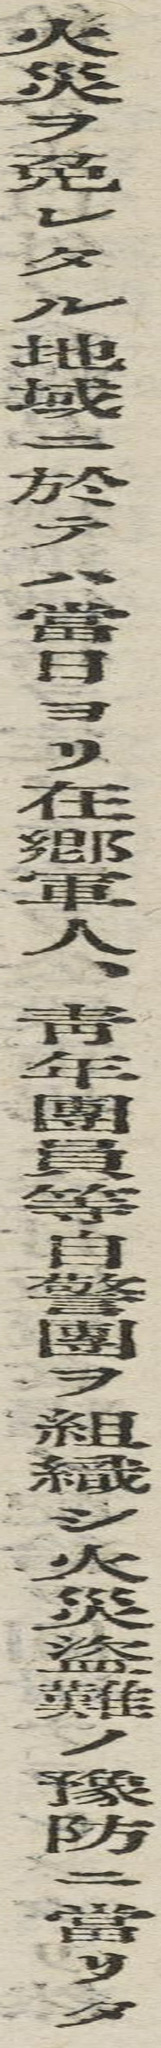火災ヲ免レタル地域ニ於テハ当日ヨリ在郷軍人、青年団員等自警団ヲ組織シ火災盗難ノ予防ニ当リタ
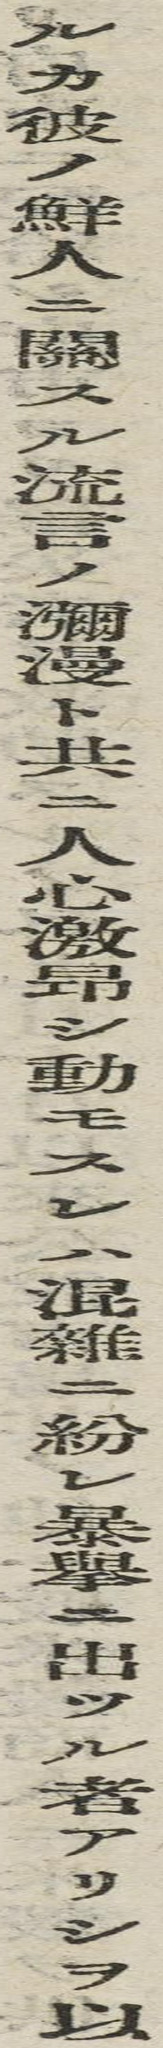ルカ彼ノ鮮人ニ関スル流言ノ瀰漫ト共ニ人心激昂シ動モスレハ混雑ニ紛レ暴挙ニ出ツル者アリシヲ以
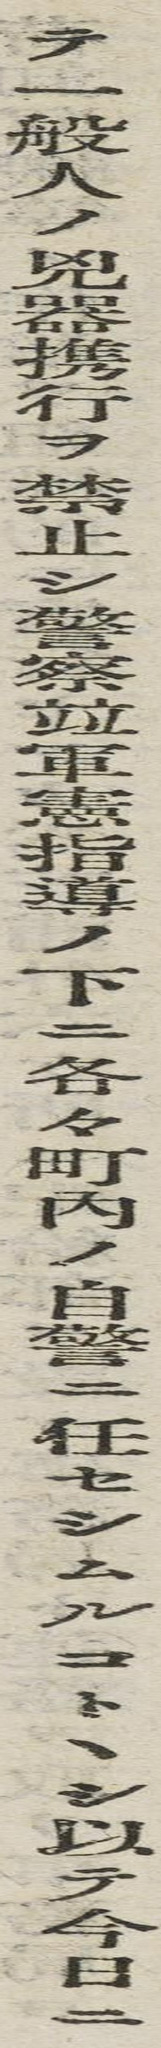テ一般人ノ凶器携行ヲ禁止シ警察並軍憲指導ノ下ニ各々町内ノ自警ニ任セシムルコトヽシ以テ今日ニ
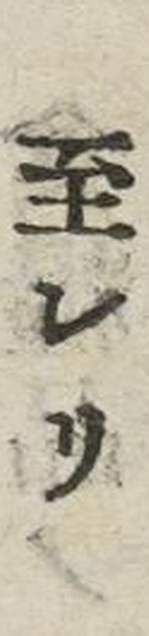至レリ
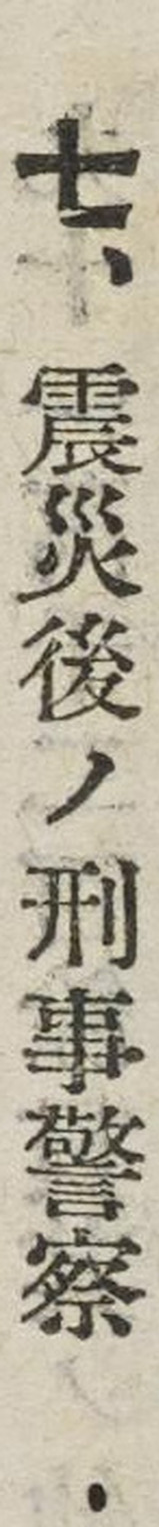七、震災後ノ刑事警察
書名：震災被害状況並救護施設概要
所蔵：東京大学地震研究所図書室 Earthquake Research Institute Library, The University of Tokyo, JAPAN
